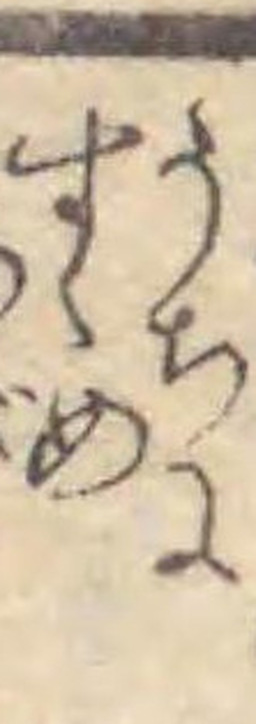すゝめ
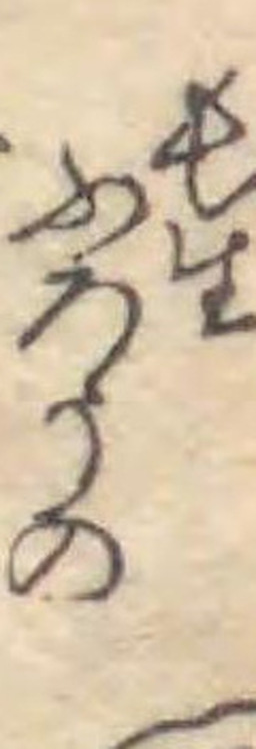ふろうの
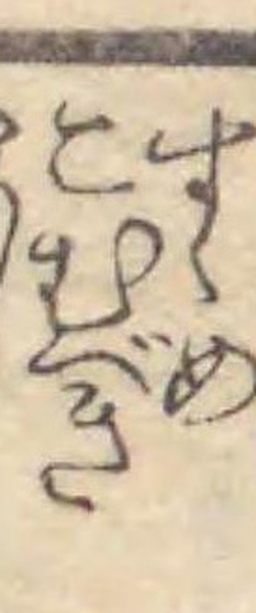こむべき
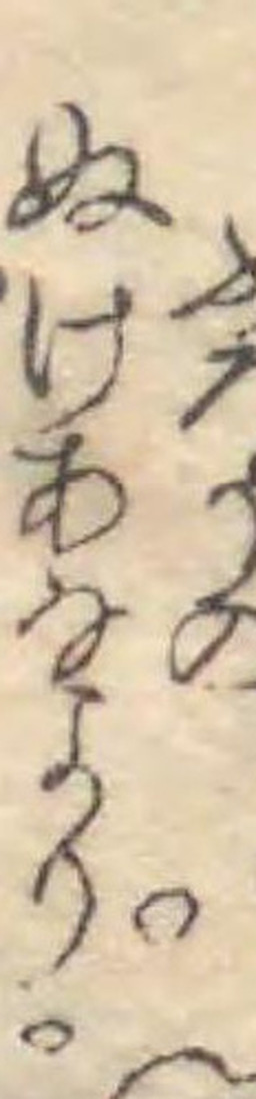ぬけあなより
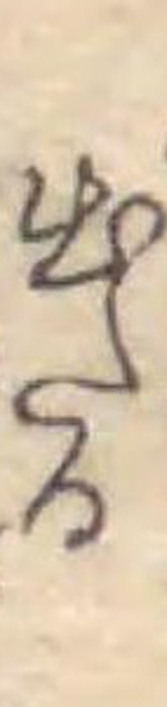出たる
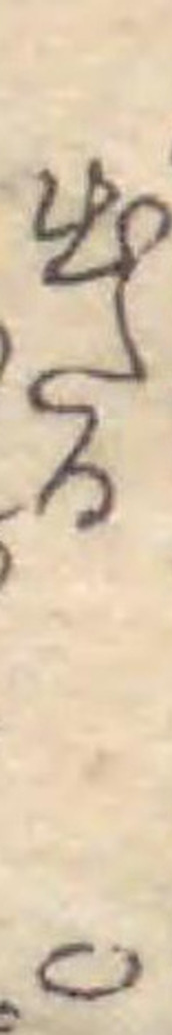出たる
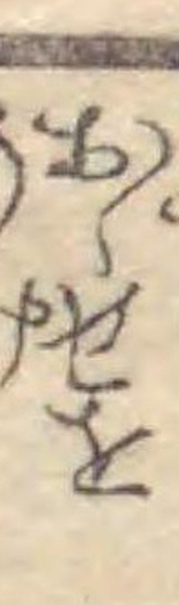おゝせを
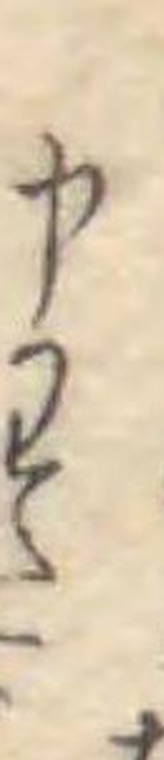申わた
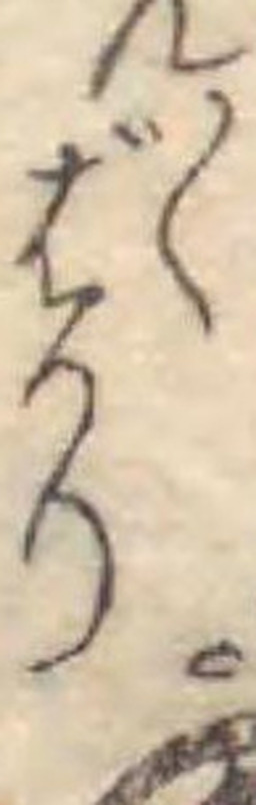ばかり
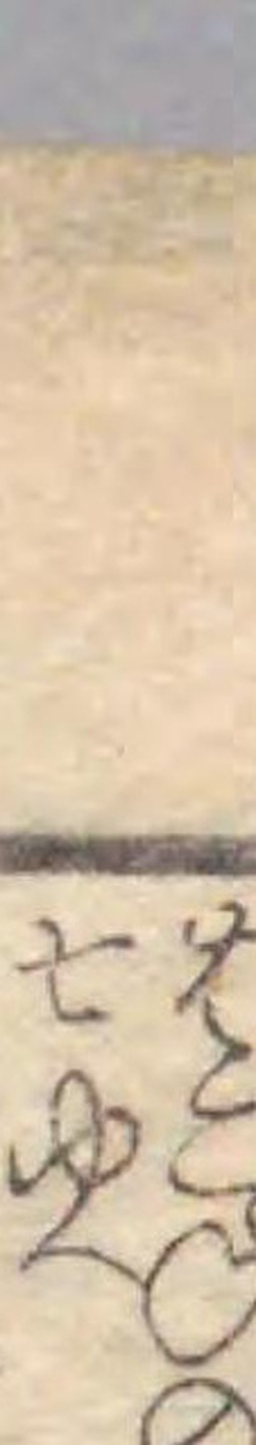七ゆへ
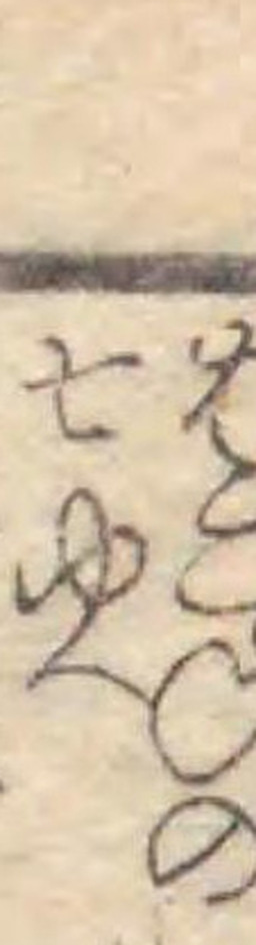七ゆへ
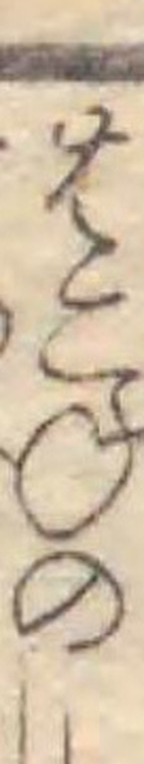はこねの
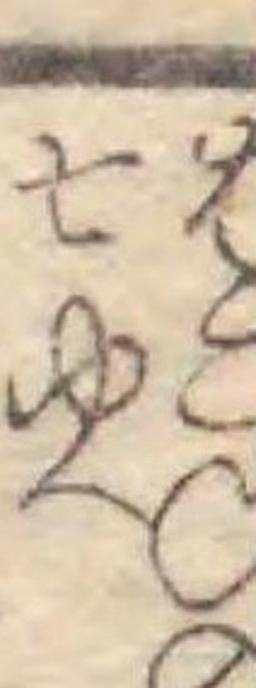七ゆへ
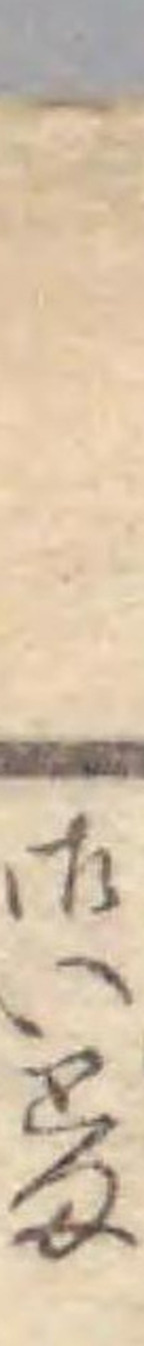御いとま
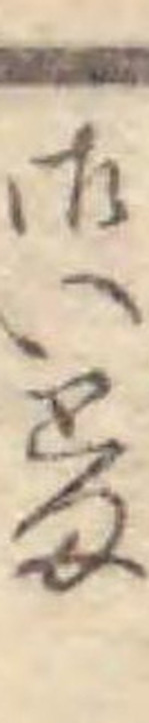御いとま
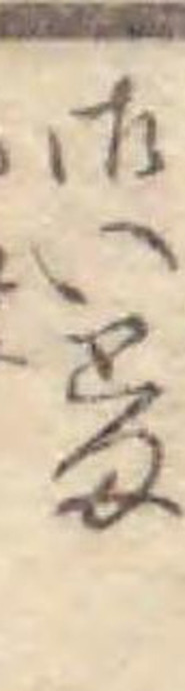御いとま
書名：文武二道万石通 : 3巻
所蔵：国立国会図書館 National Diet Library, JAPAN
